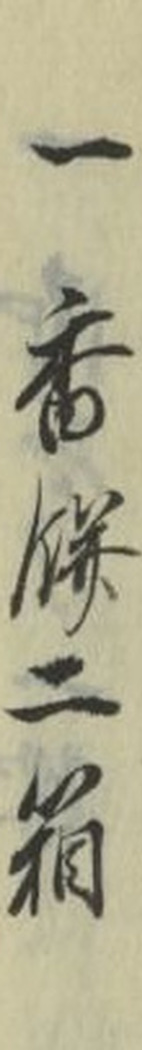一香餅二箱
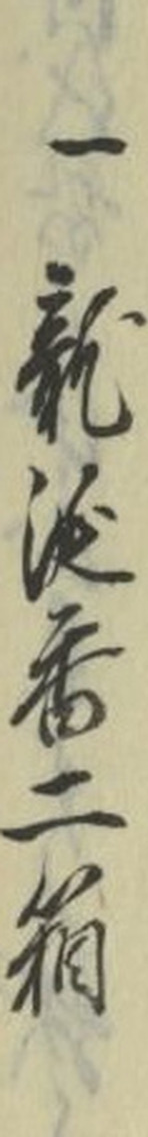一龍涎香二箱
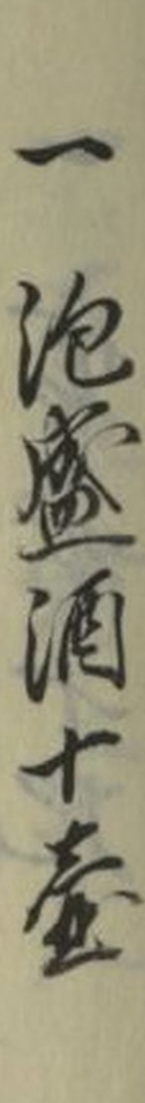一泡盛酒十壺
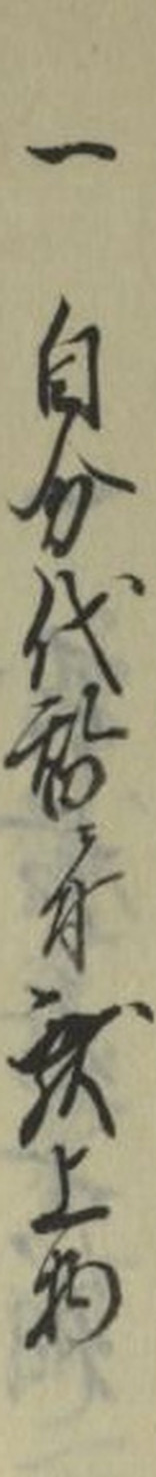一自分代替に付献上物
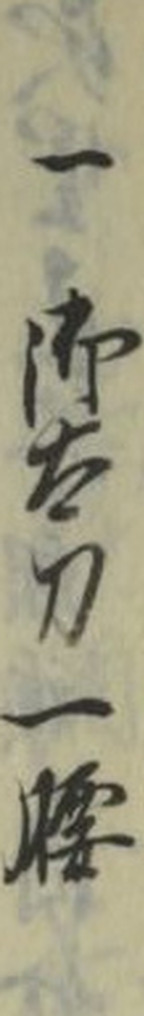一御太刀一腰
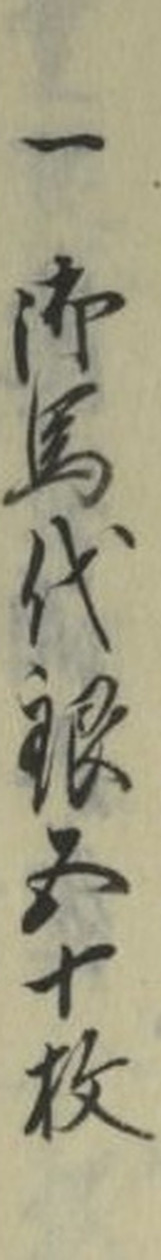一御馬代銀五十枚
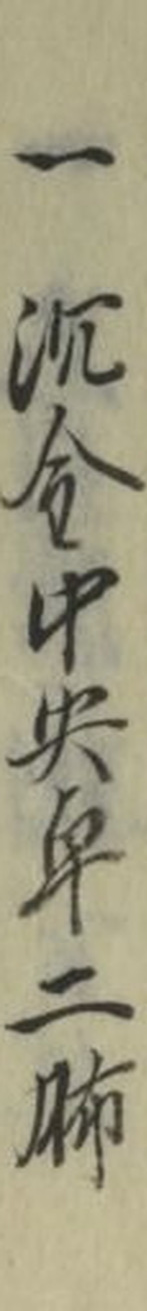一沈金中央卓二脚
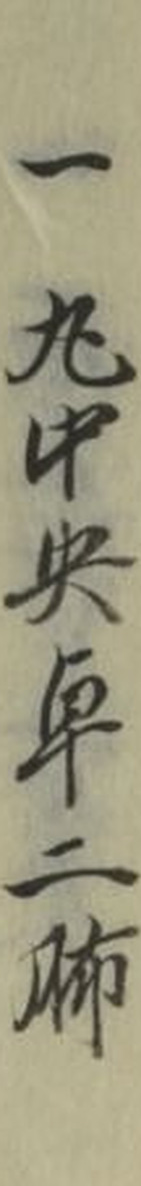一丸中央卓二脚
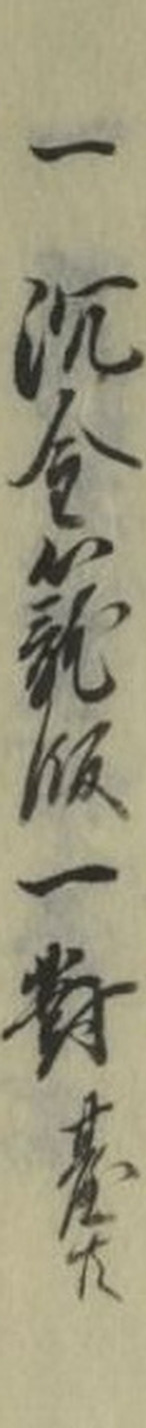一沈金籠飯一対台共
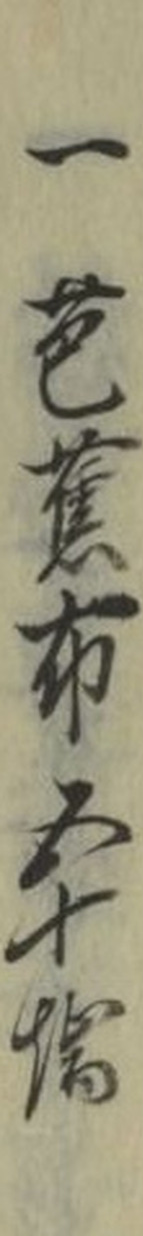一芭蕉布五十端

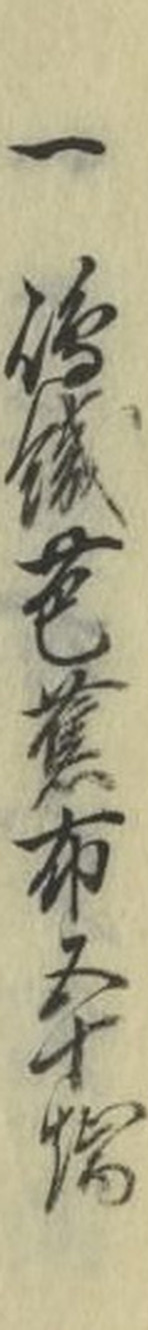一嶋織芭蕉布五十端
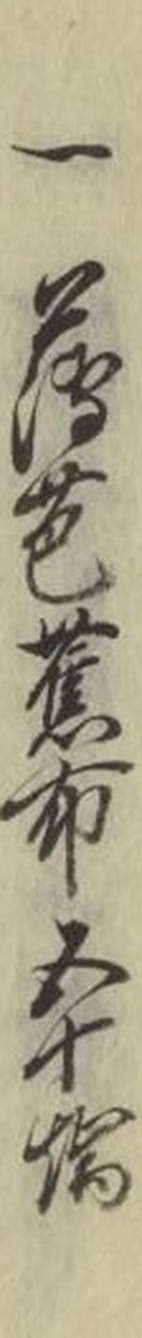一薄芭蕉布五十端
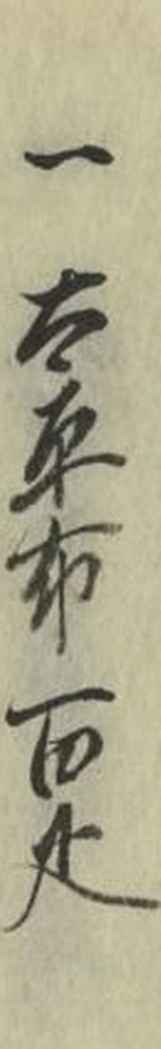一太平布百疋
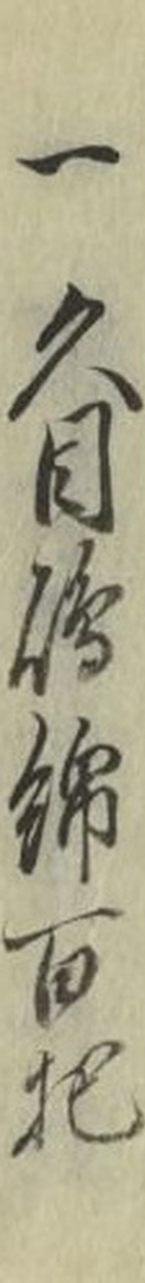一久目嶋綿百把
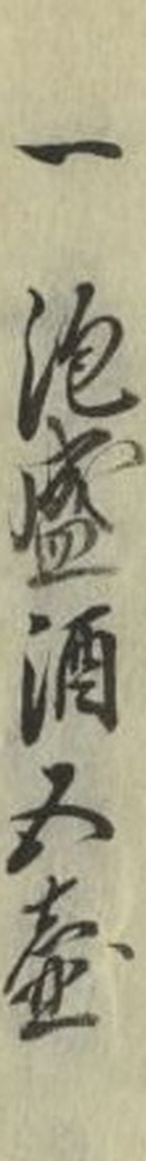一泡盛酒五壺
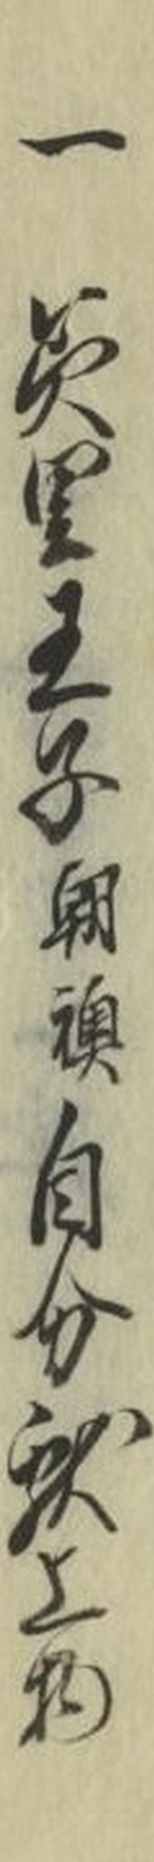一美里王子朝襖自分献上物
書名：琉球人参府記
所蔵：University of the Ryukyus Library
